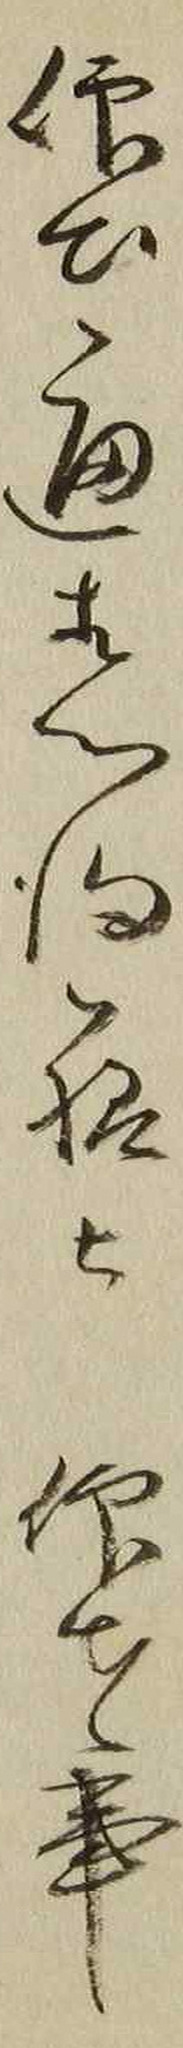仰出候通相心得候様被仰出候事
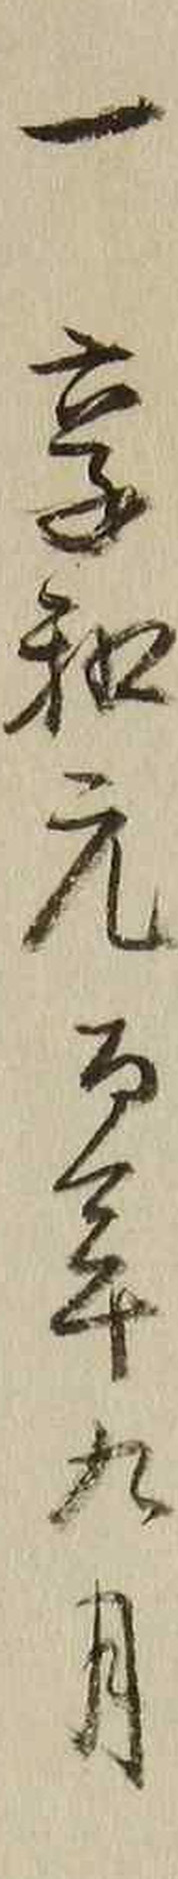一享和元酉年九月
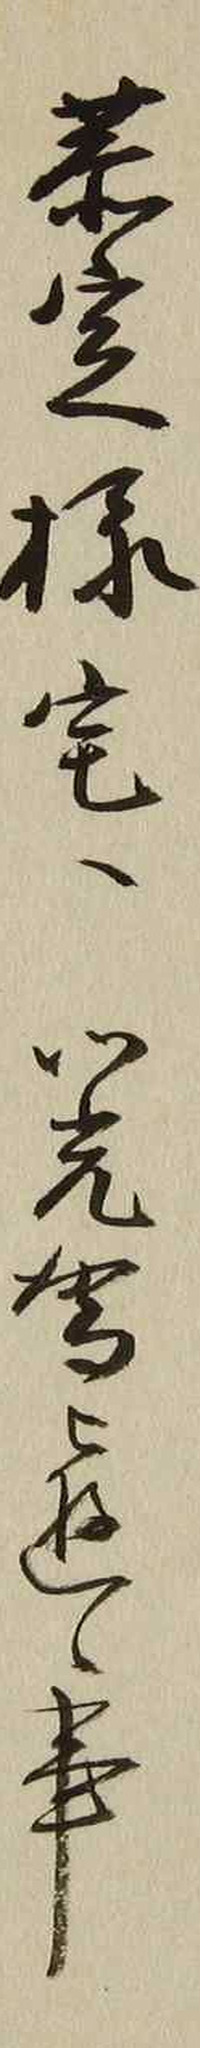恭定様宅へ御光駕被遊候事
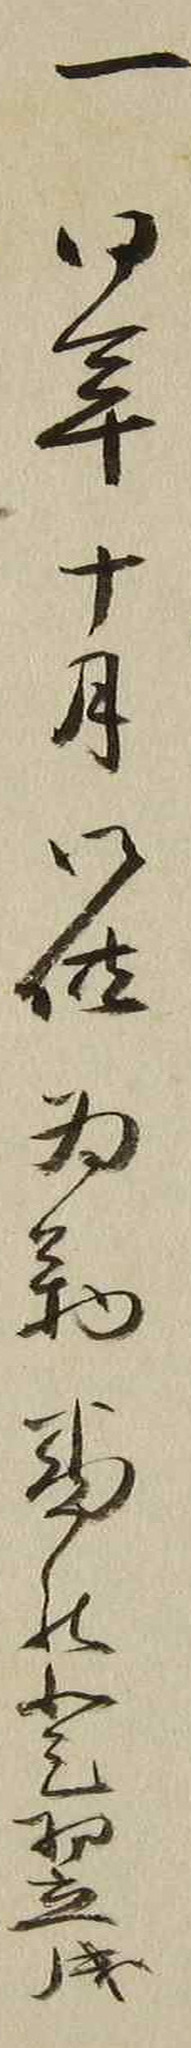一同年十月御供為勤番罷登翌戌
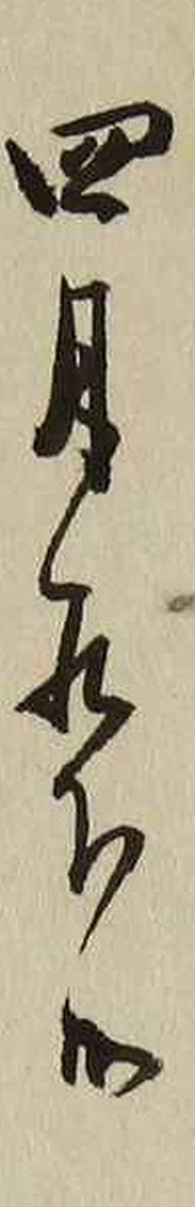四月罷下候
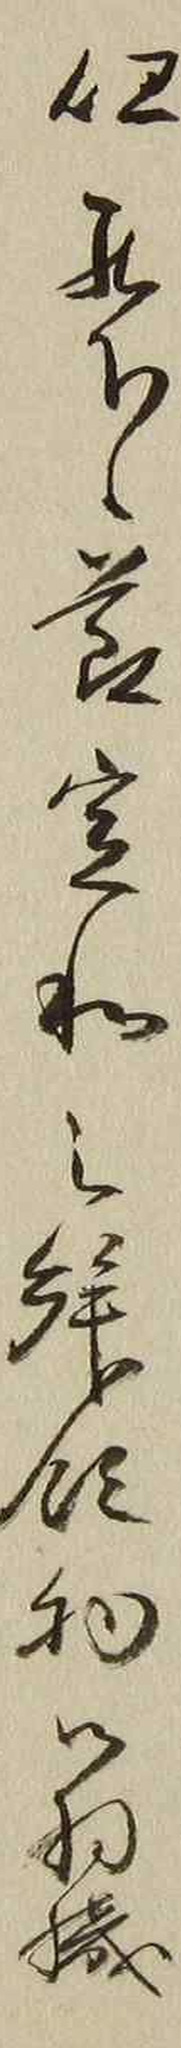但罷下候節定和之拝領物御羽織
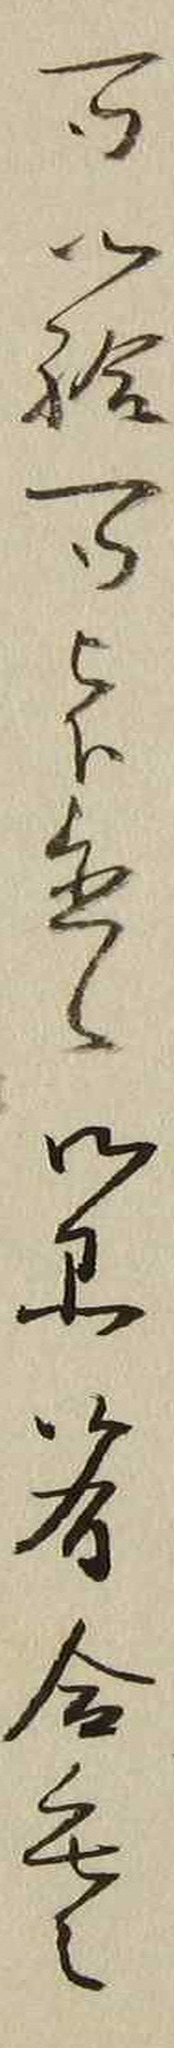一つ御袷一つ被下置候御品御有合無之
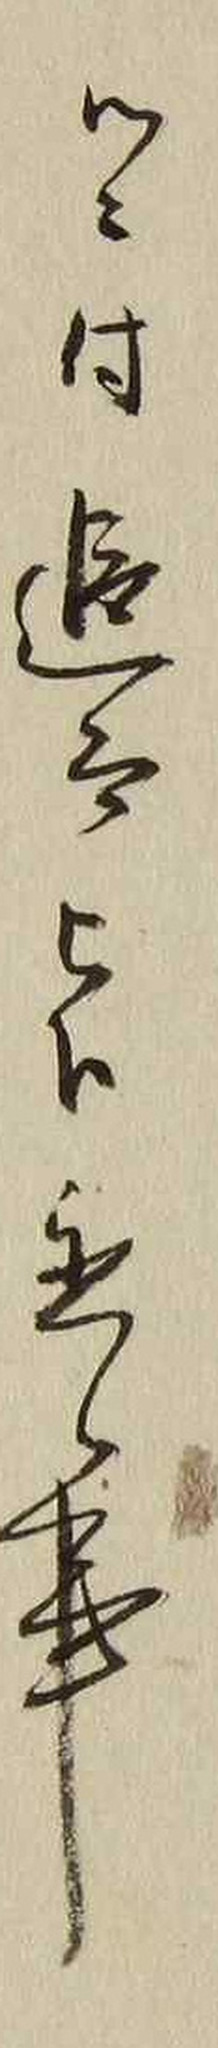候に付追而被下置候事
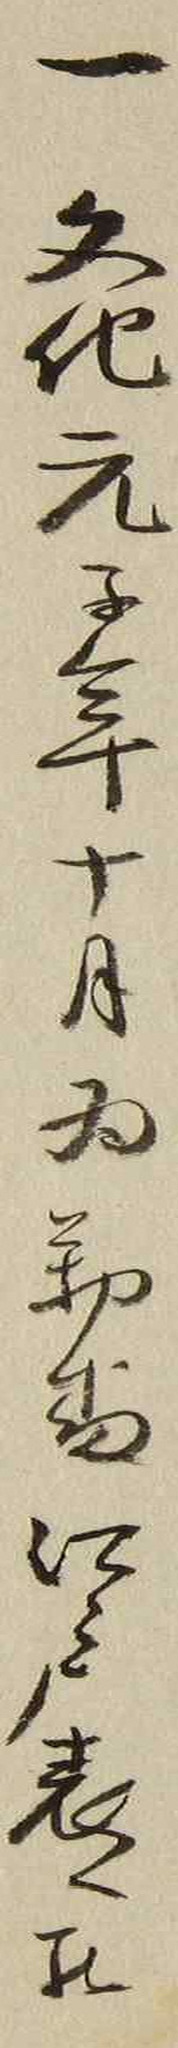一文化元子年十月為勤番江戸表へ罷
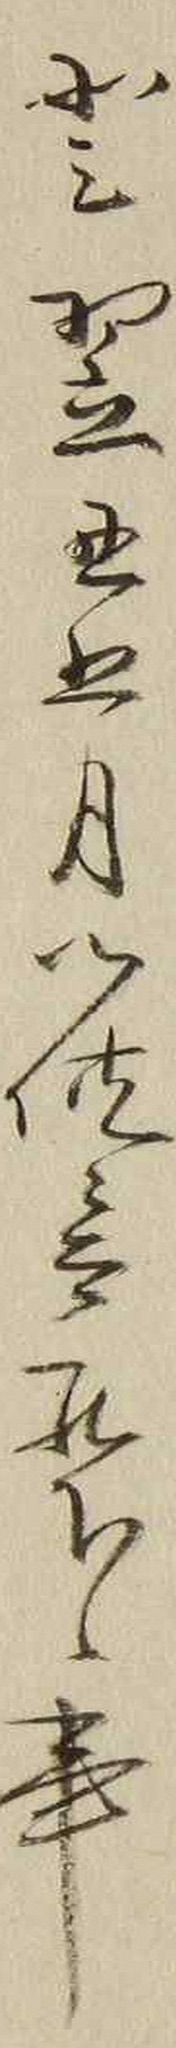登翌丑五月御供に而罷下候事
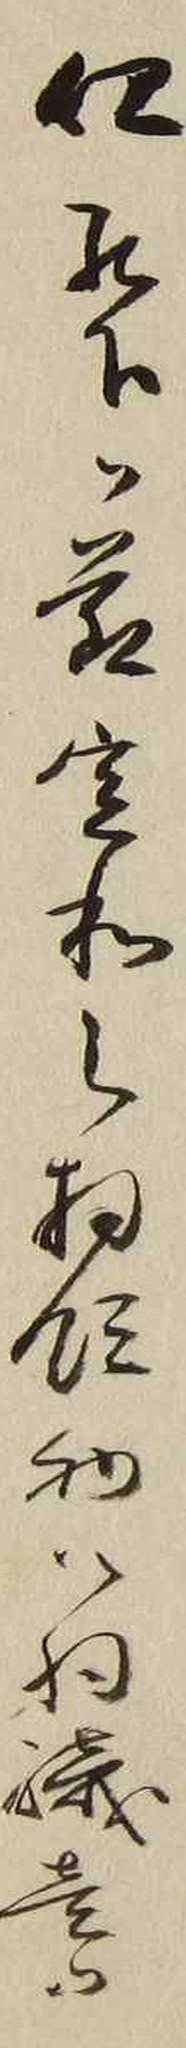但罷下候節定和之拝領物御羽織壱つ
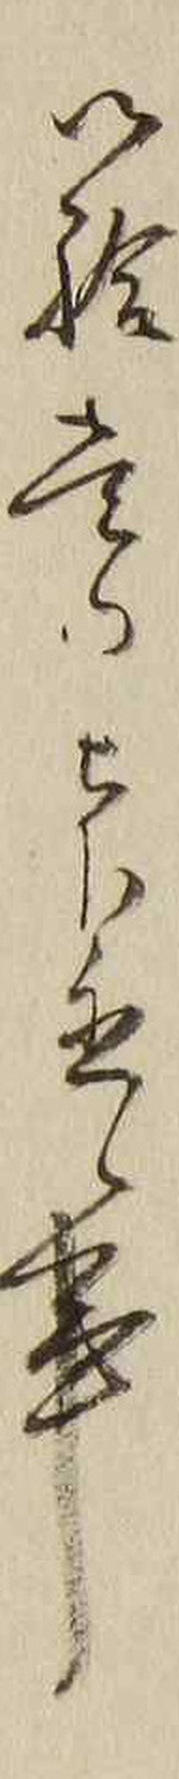御袷壱つ被下置候事

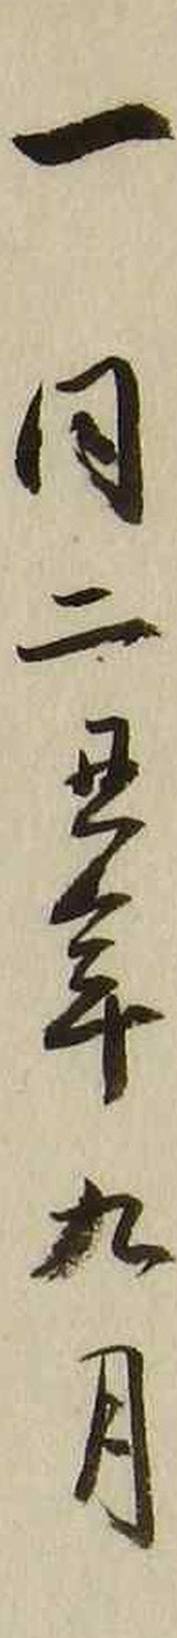一同二丑年九月
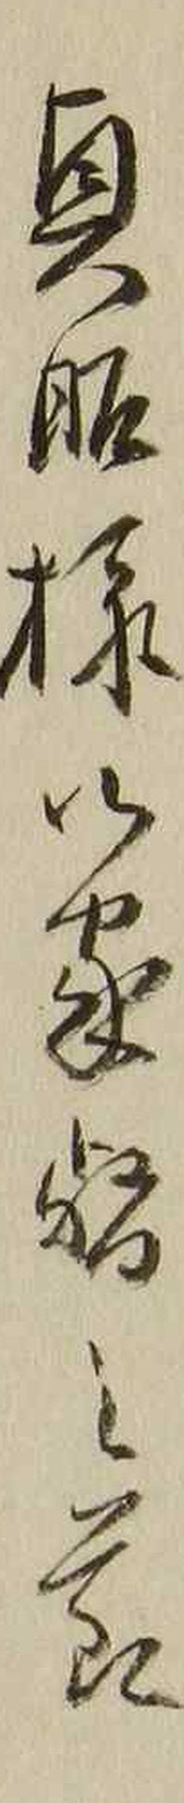貞昭様御家督之節
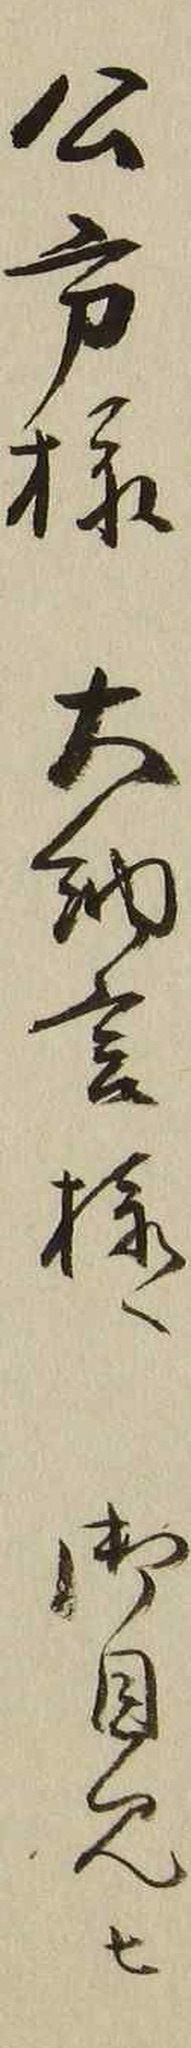公方様大納言様へ御目見被
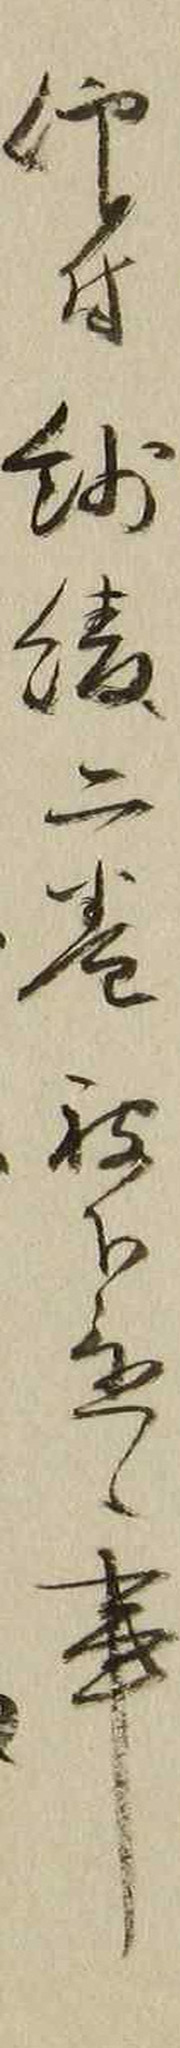仰付紗綾二巻被下置候事
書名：諸士系譜　巻之292　き之部1
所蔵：会津若松市立会津図書館
